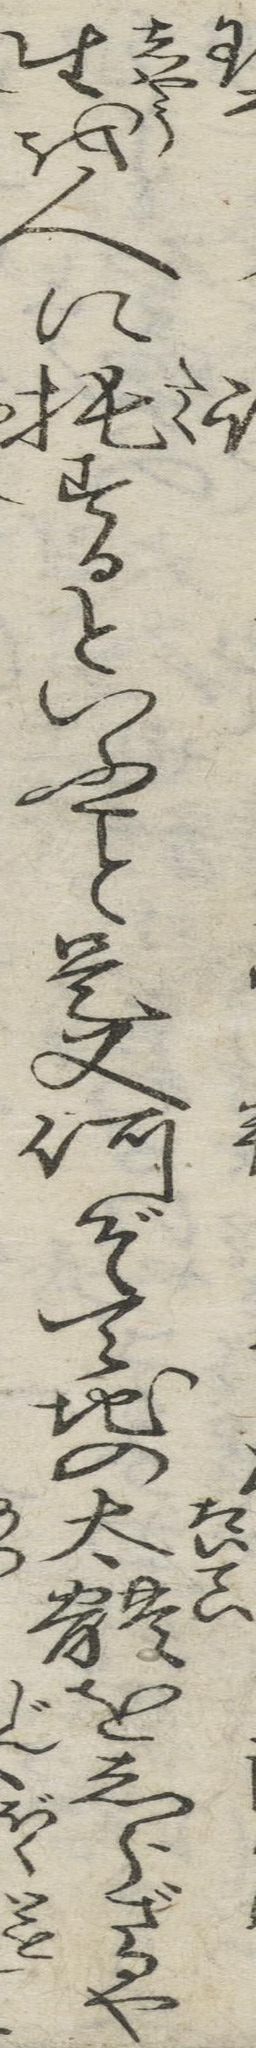生を人に托するといふこと是又何ぞ天地の太躰をしらざるや
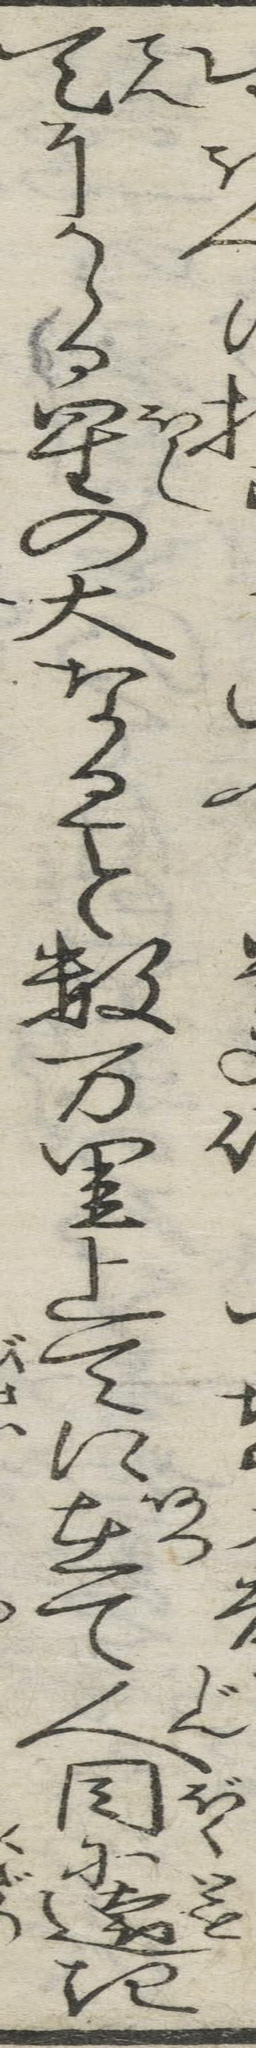天にかゝる星の大なること数万里上天に在て人目に遠き
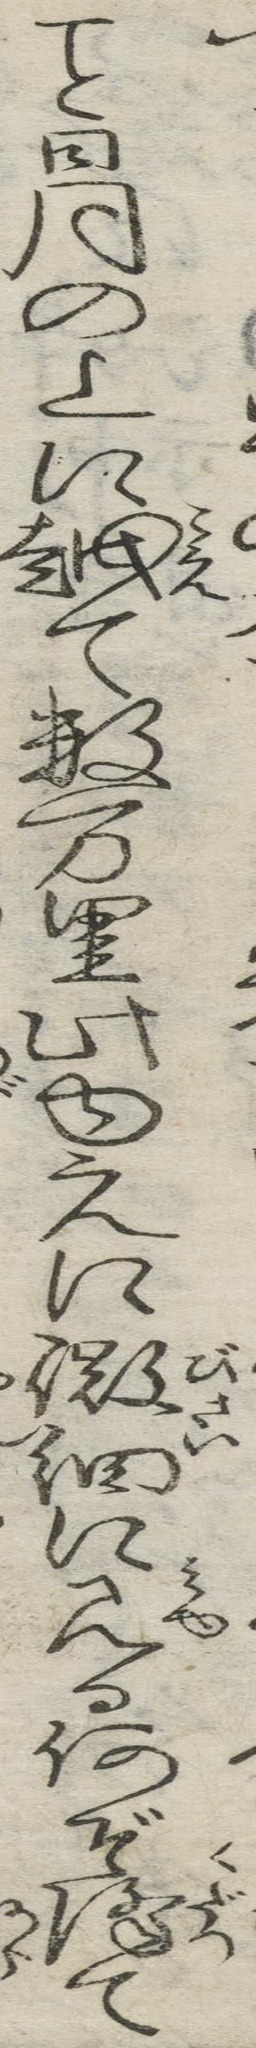こと日月の上に越て数万里此ゆへに微細に見る何ぞ降て
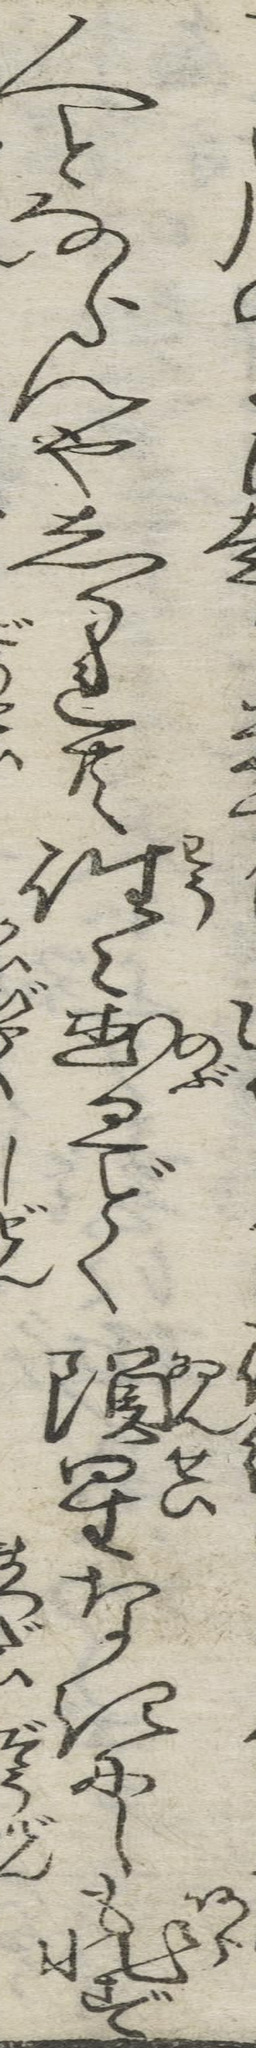人とならんやしかれども往こ述るごとく隕星なきにしも非
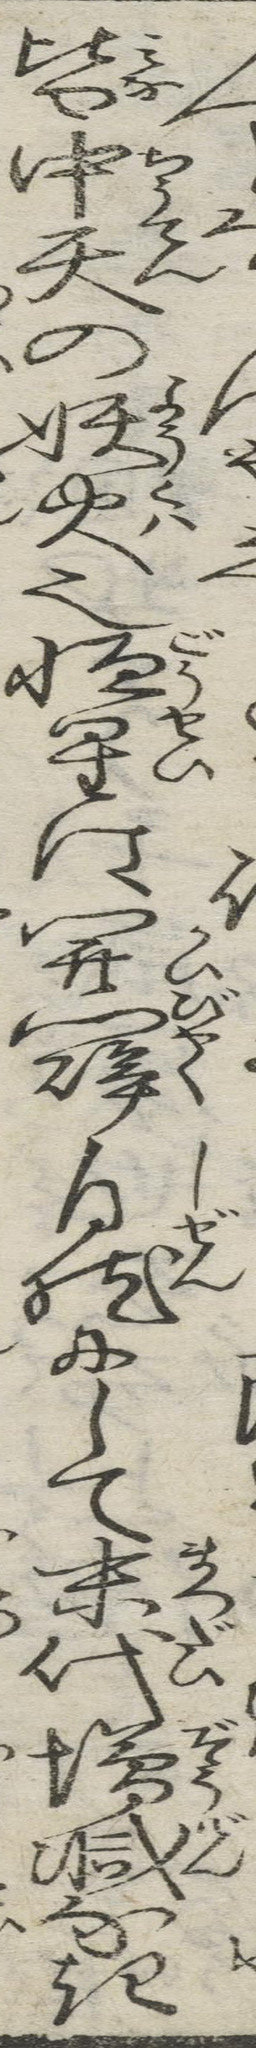皆中天の妖火也恒星は開闢自然にして末代増減なき
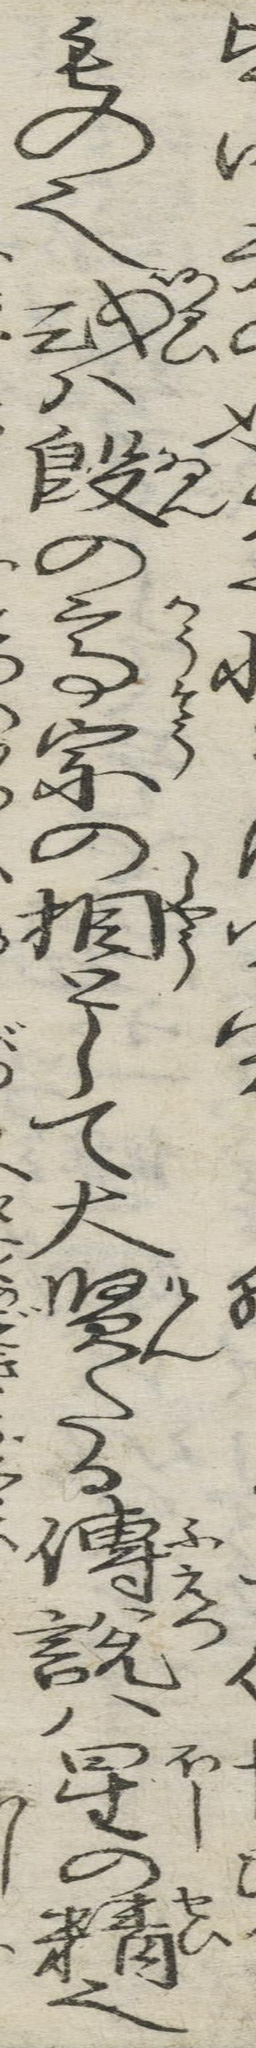もの也或は殷の高宗の相として大賢たる傳説は星の精也
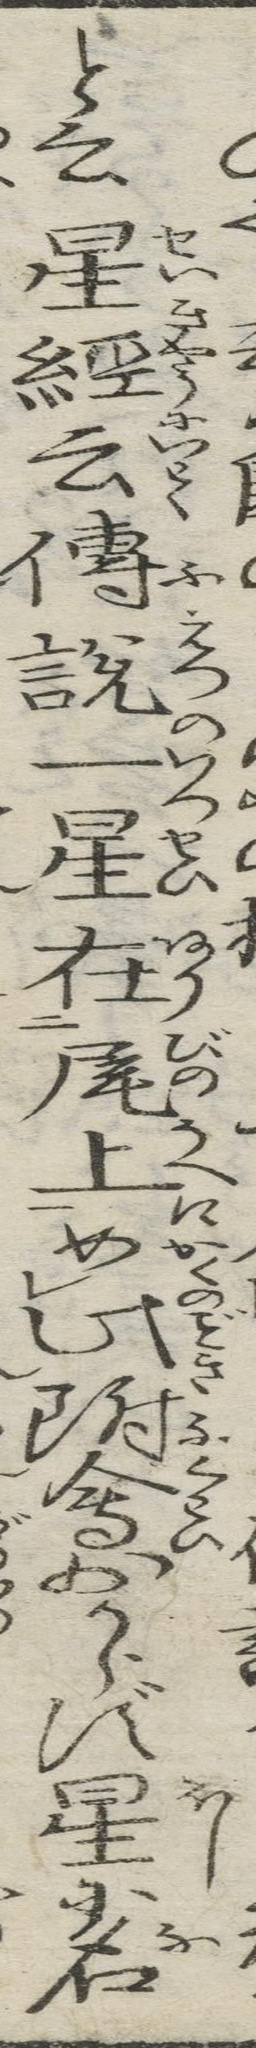と云星経云傳説一星在尾上如此附会なからず星に名
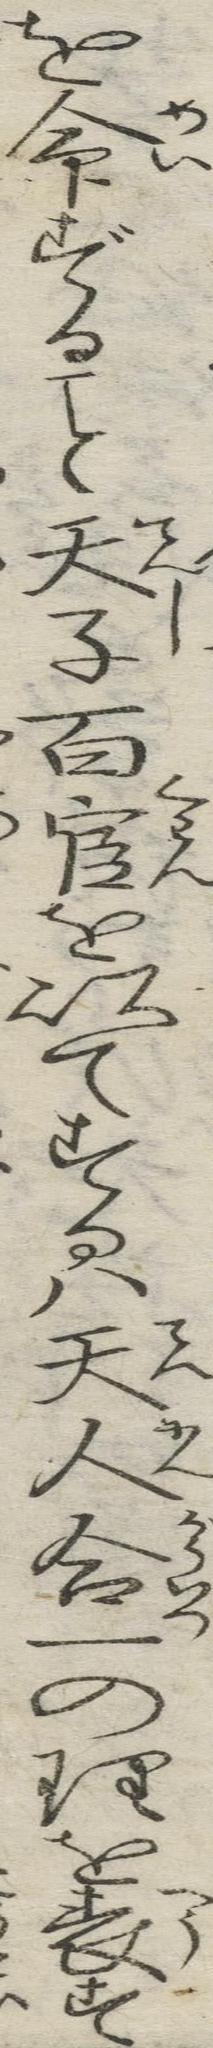を命ずること天子百官を以てするは天人合一の理を表す
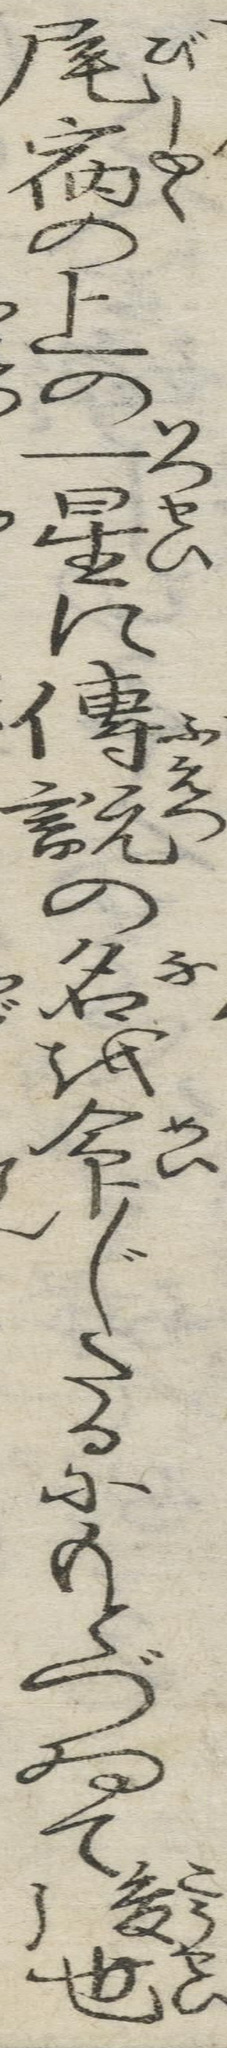尾宿の上の一星に傳説の名を命じたるにもとづゐて後世
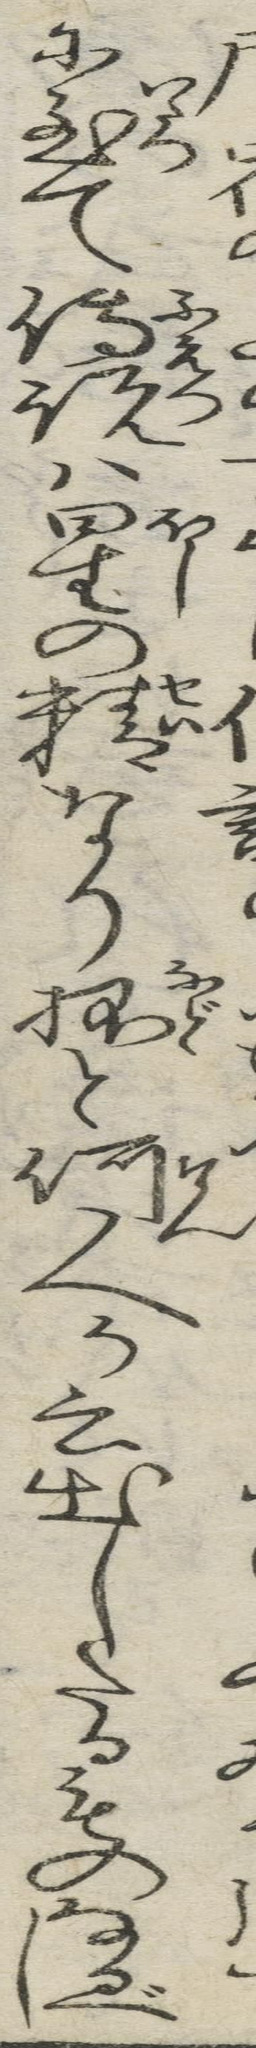に至て傳説は星の精なり抔と何人か云出したるものなるべし
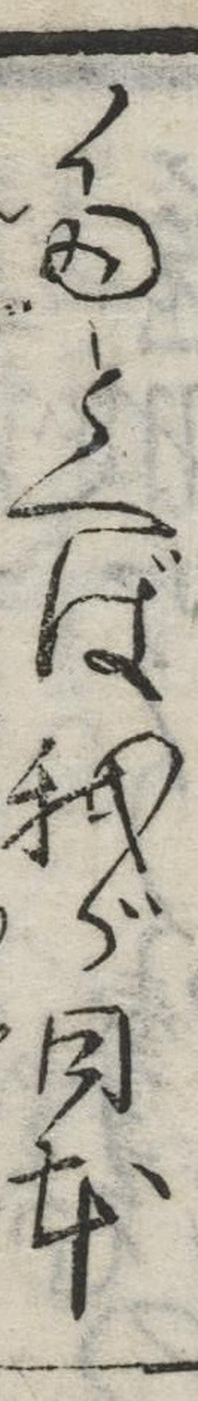たとへば我が日本
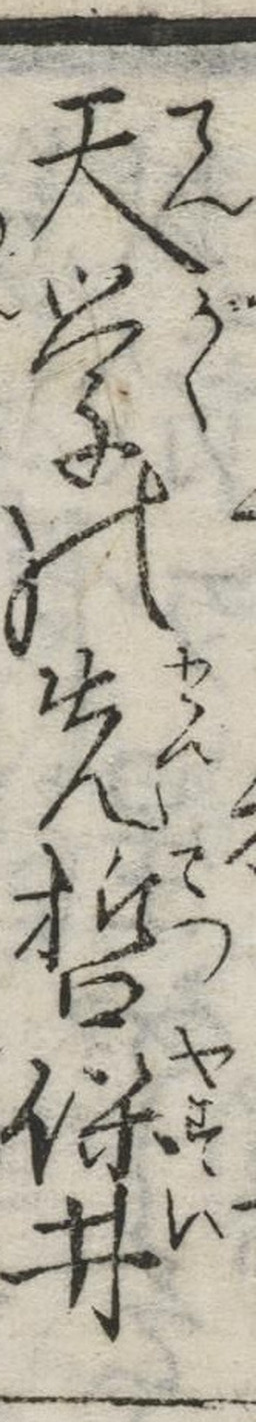天学の先哲保井
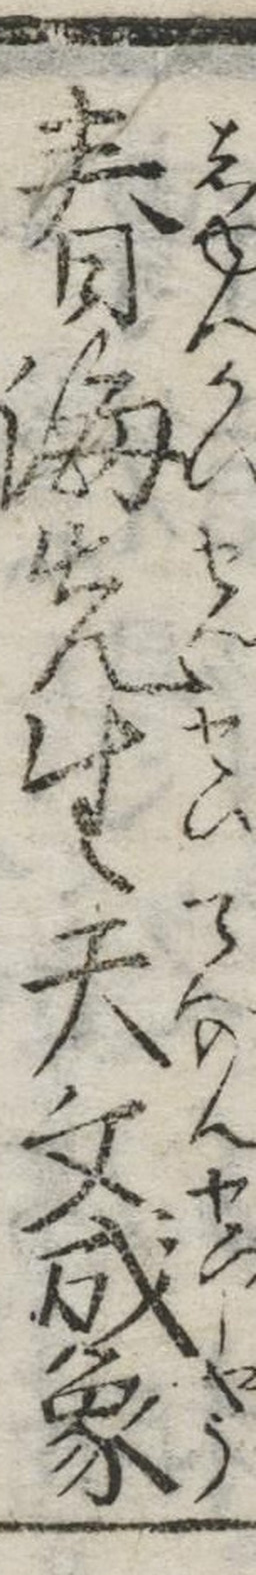春海先生天文成象
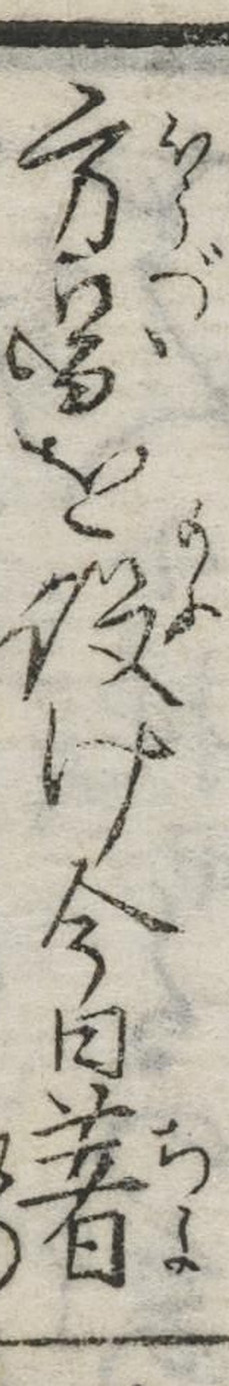方圖を設け今日著
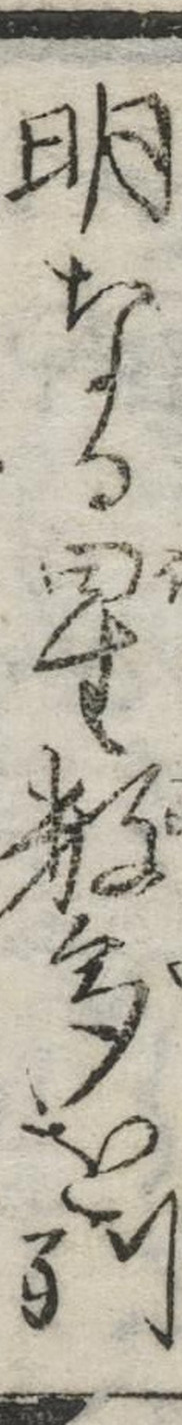明なる星数多を列雩
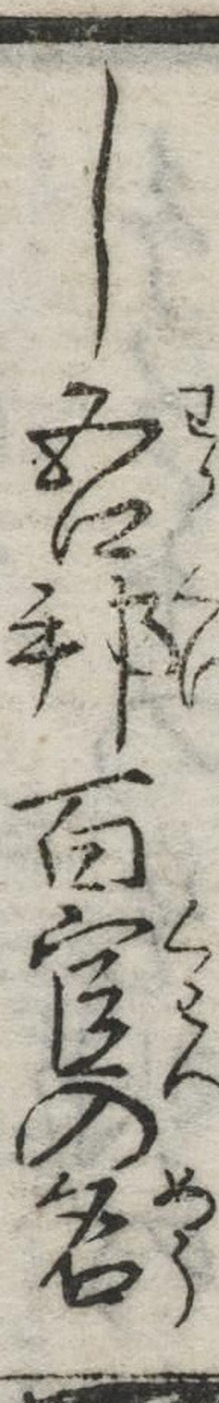し我邦百官の名
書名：訓蒙天地辨　人
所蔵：東京大学地震研究所図書室 Earthquake Research Institute Library, The University of Tokyo, JAPAN
